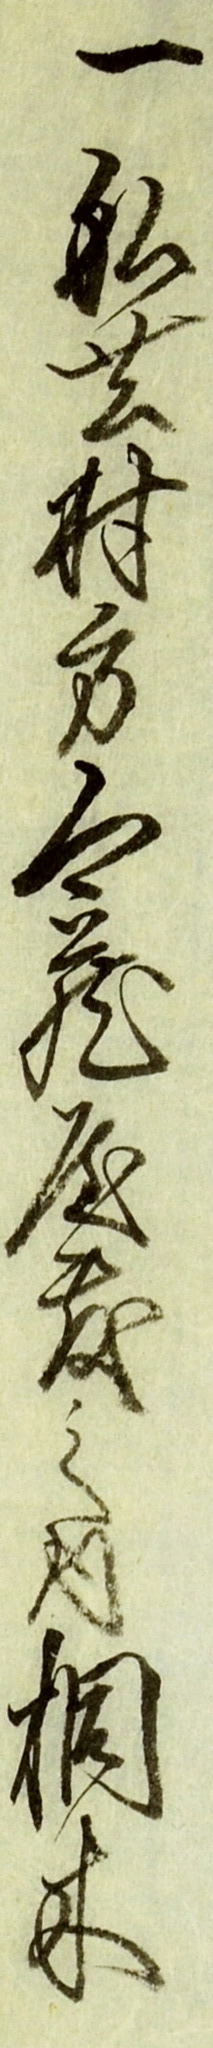一私共村方郷蔵屋敷之内桐木
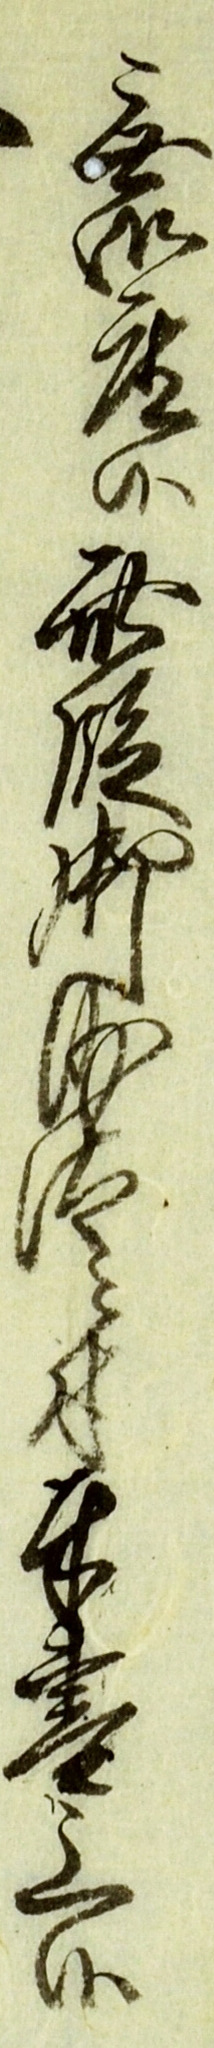無御座候此段御沙汰ニ付奉書上候
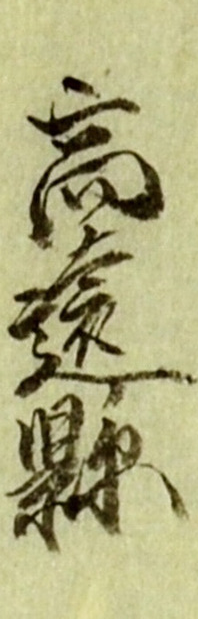高遠県
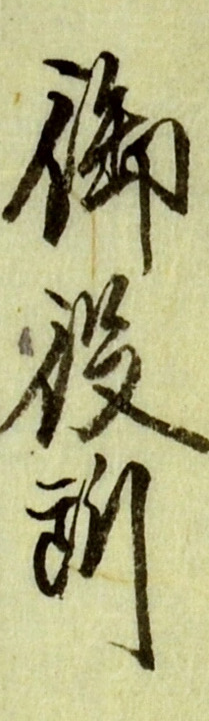御役所
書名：乍恐奉書上候
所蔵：伊那市立高遠町図書館・合同会社AMANE
